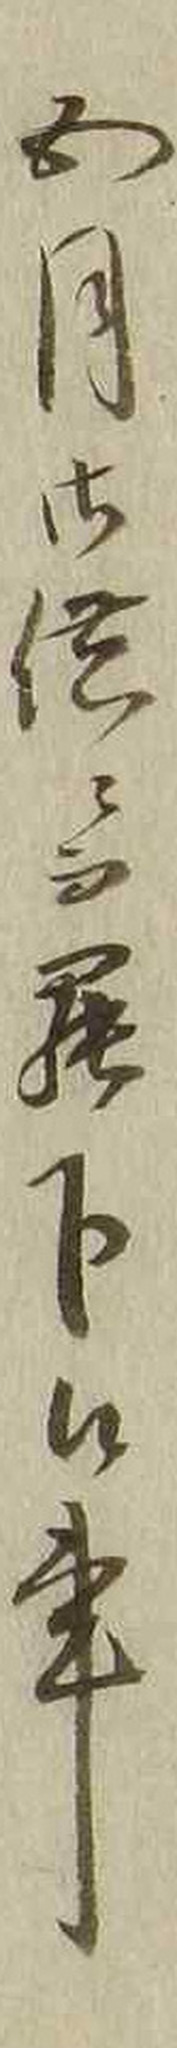五月御供に而罷下候事
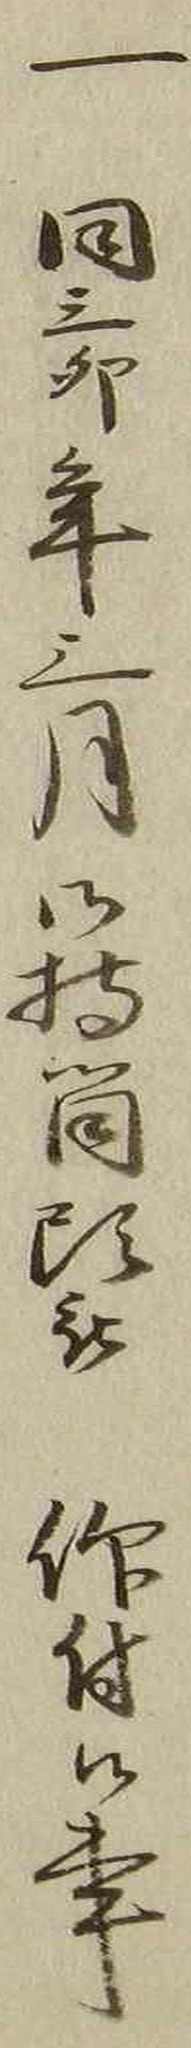一同三卯年三月御持筒頭被仰付候事
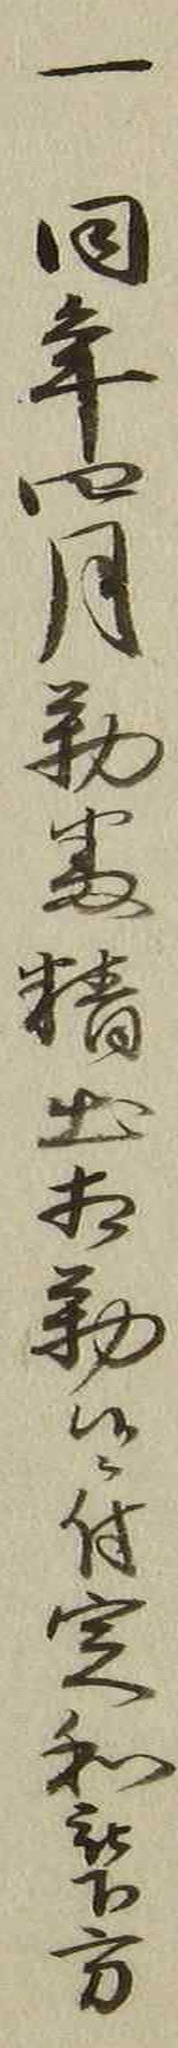一同年四月勤番精出相勤候に付定和被下方
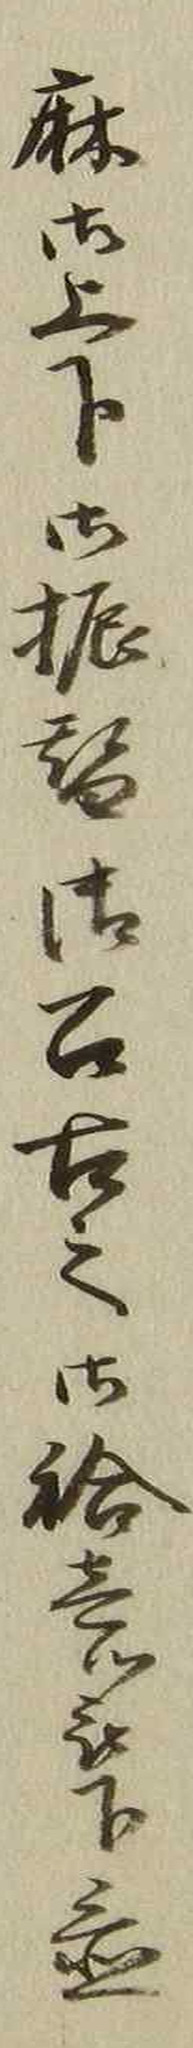麻御上下御振替御召古之御袷壱つ被下置
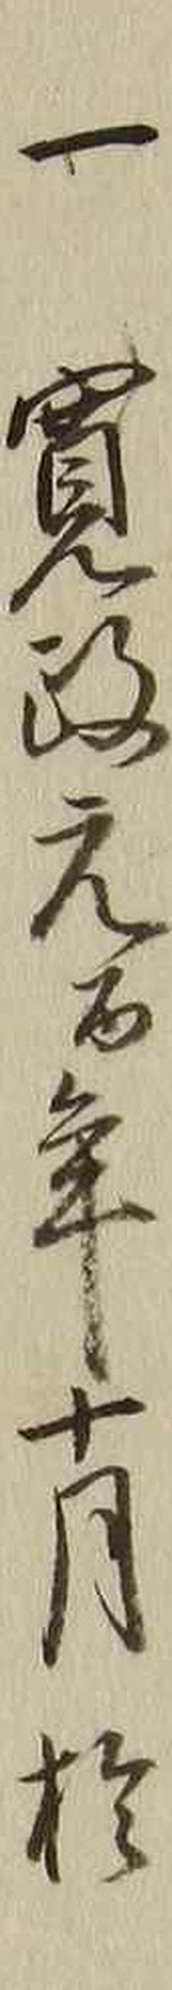一寛政元酉年十月於
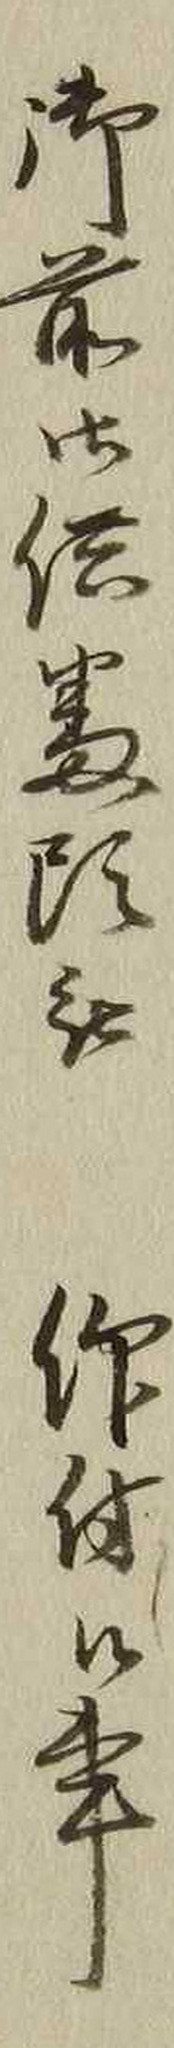御前御供番頭被仰付候事
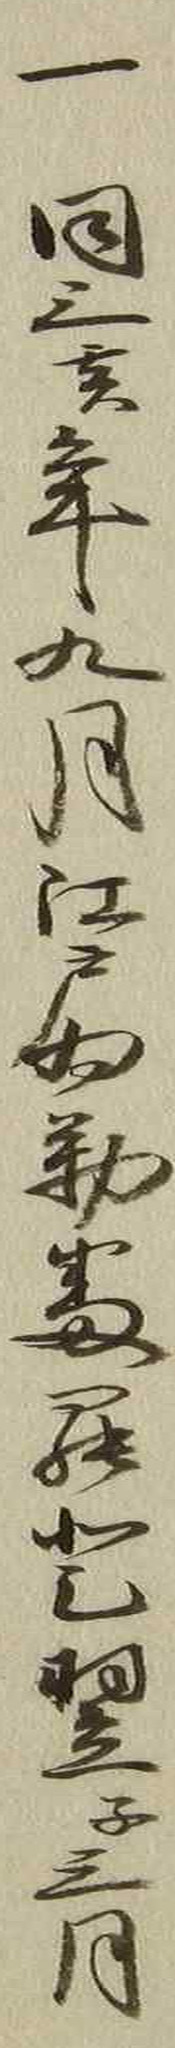一同三亥年九月江戸為勤番罷登翌子三月
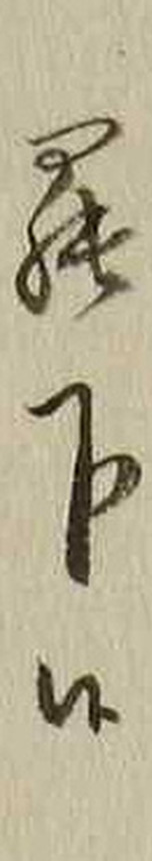罷下候
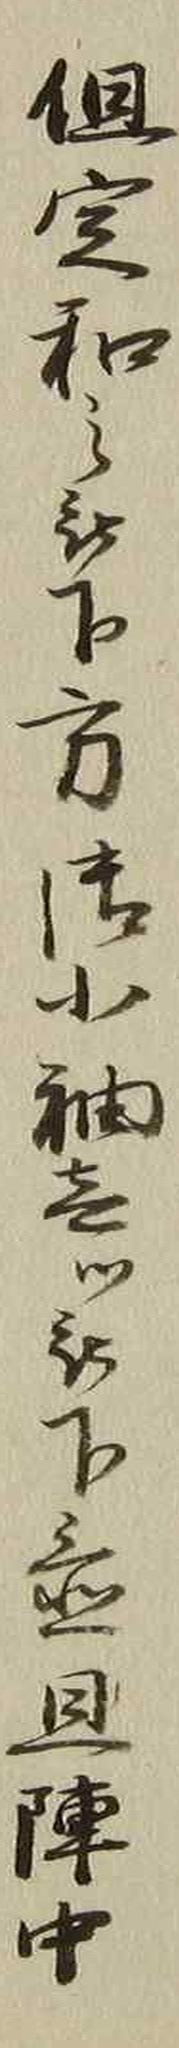但定和之被下方御小袖壱つ被下置且陣中
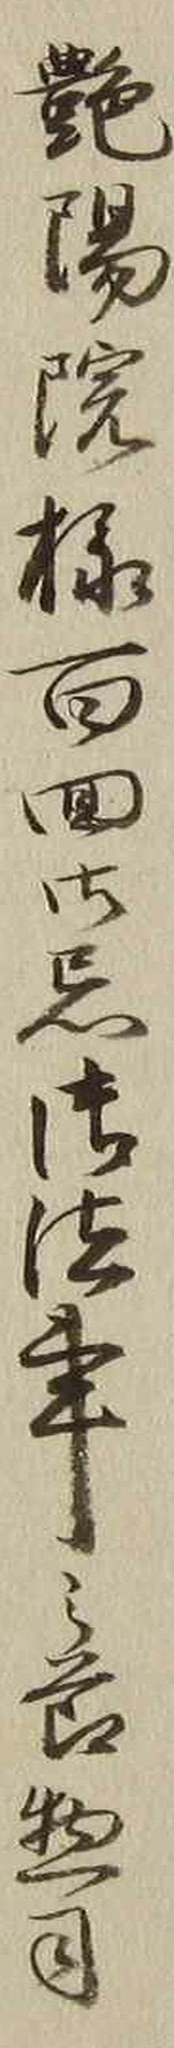艶陽院様百回御忌御法事之節惣司
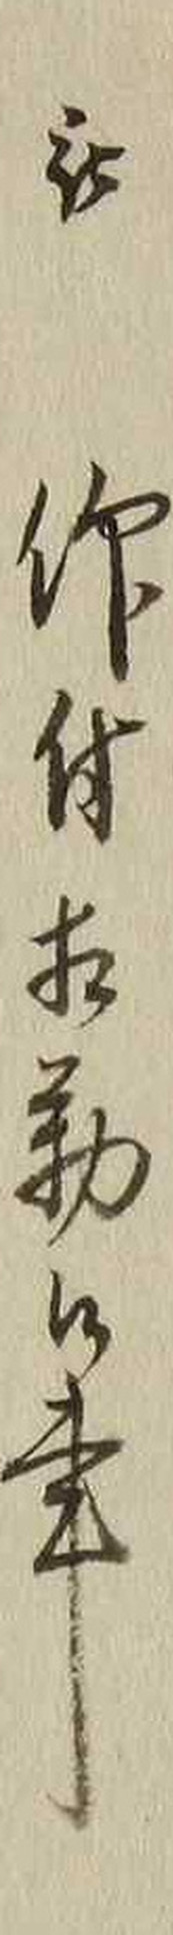被仰付相勤候事
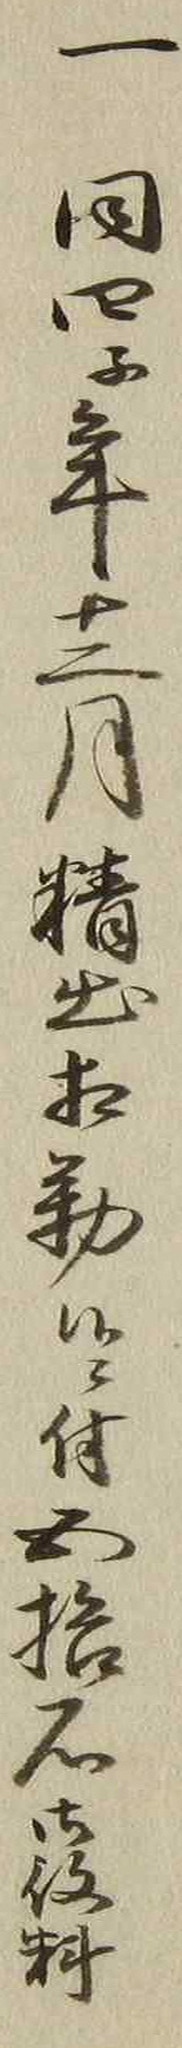一同四子年十二月精出相勤候に付五拾石御役料
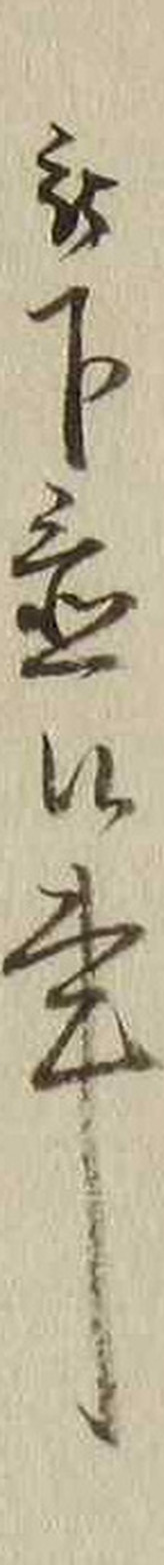被下置候事
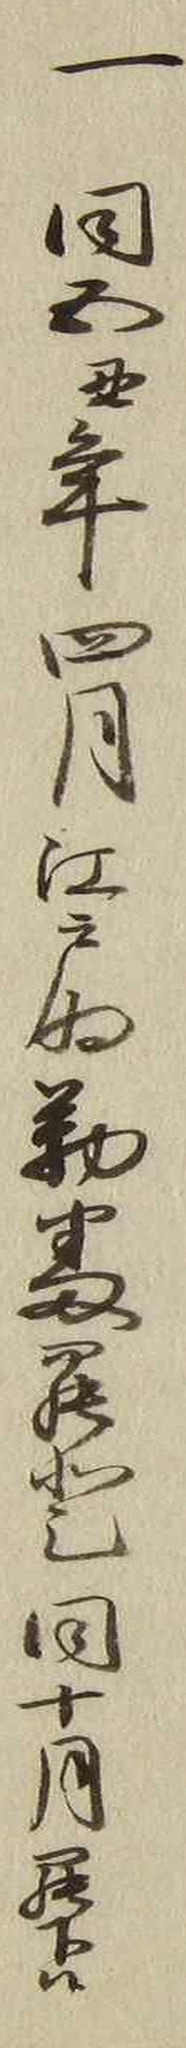一同五丑年四月江戸為勤番罷登同十月罷下候
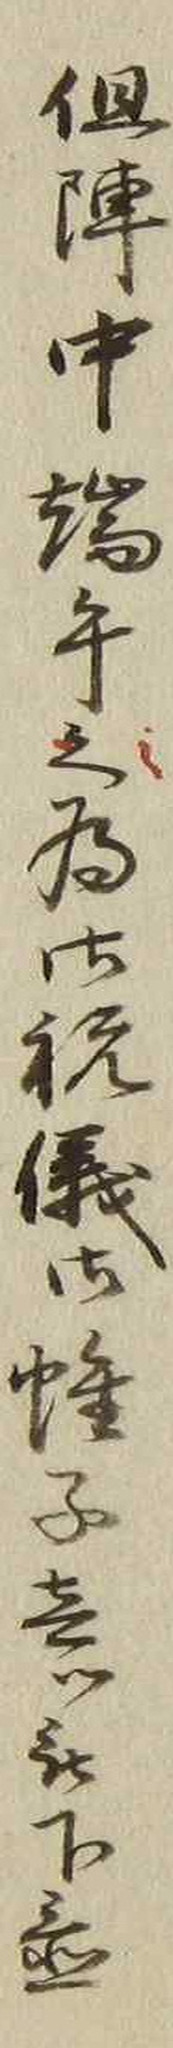但陣中端午之為御祝儀御帷子壱つ被下置
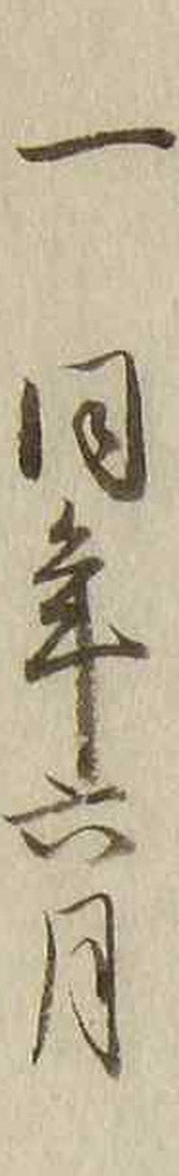一同年六月
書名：諸士系譜　巻之133　た之部9
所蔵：会津若松市立会津図書館
